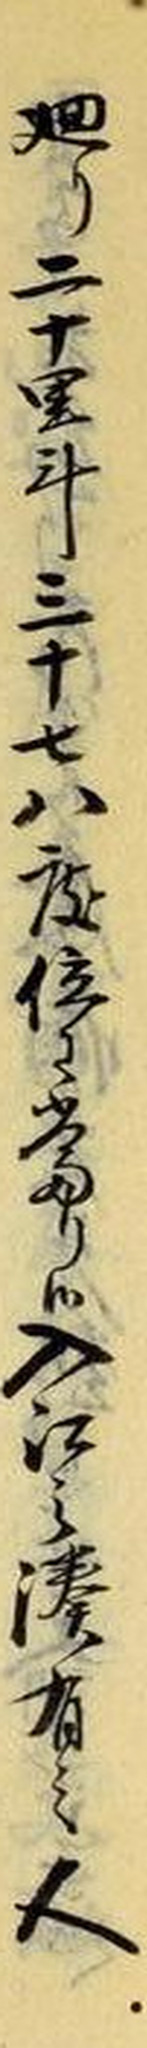廻り二十里計三十七八度位に当り候入江之湊有之人
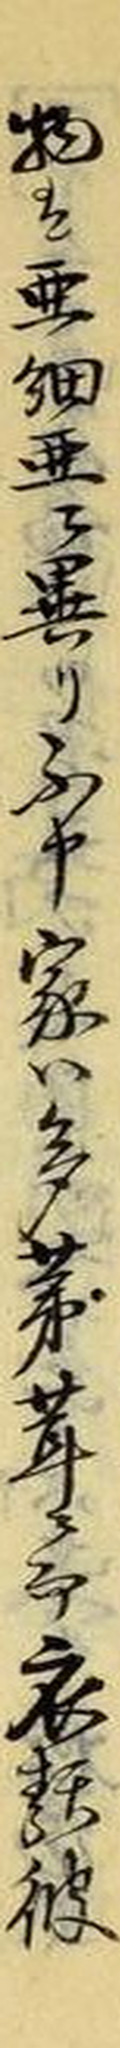物は亜細ニ異り不申家ハ多茅葺ニ而衣類は
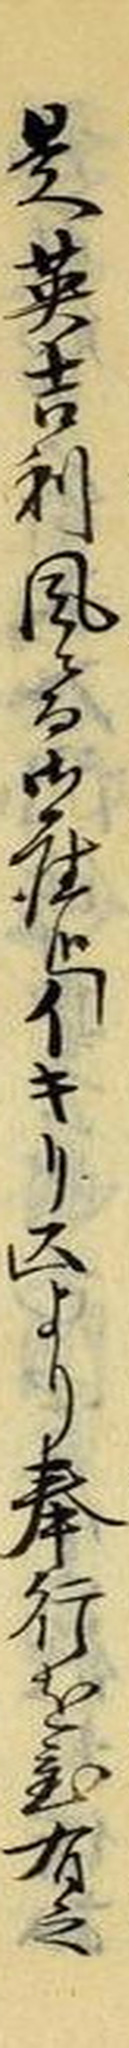是英吉利風ニ而御座候「イキリス」より奉行を置有之
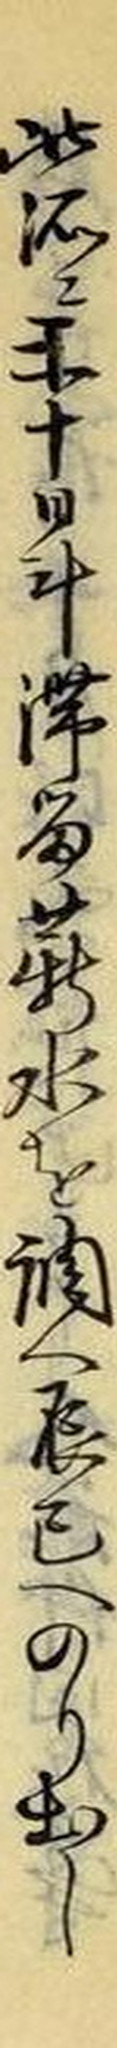此所ニ十日計滞留薪水を調え辰巳へのり出し
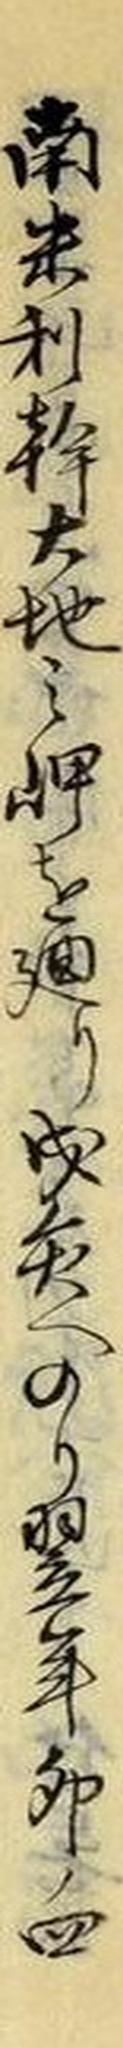南米利幹大地之岬を廻り戊戌へのり翌年卯ノ四
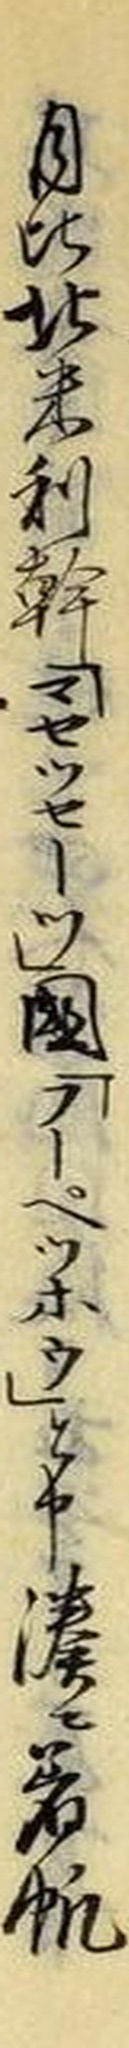月頃北米利幹「マセツセーツ」国「フーぺツホウ」と申湊ニ着
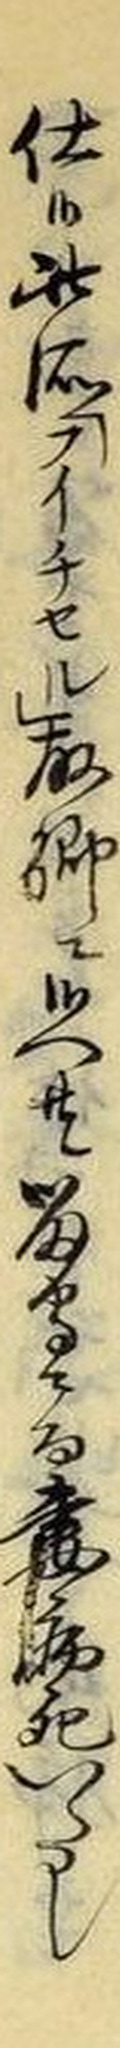仕候此所「フイチセル」故郷ニ候へ共留守ニ而妻病死いたし
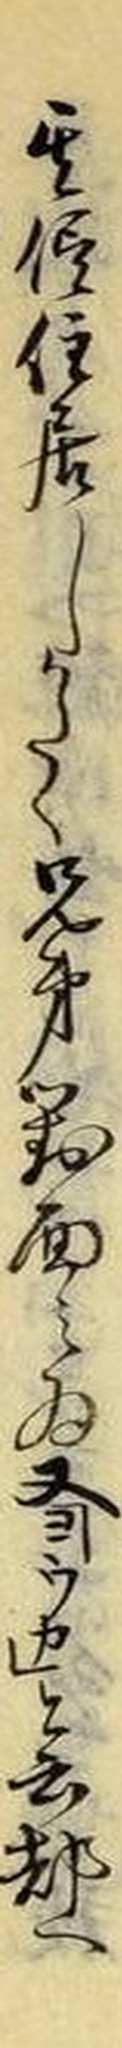其侭住居したく兄弟対面之為又「ヨウカ」と云都へ
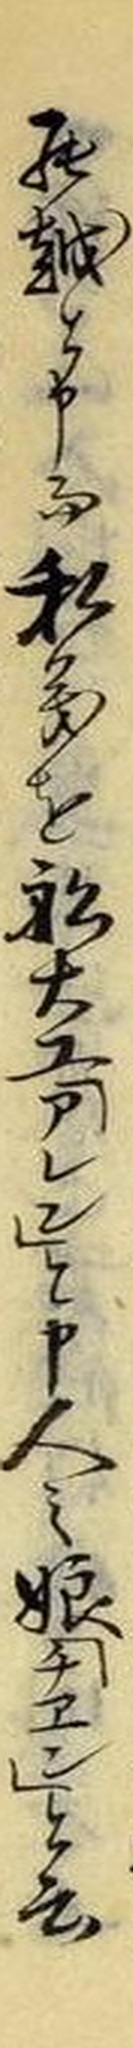罷越と申而私義を船大工「アレン」と申人之娘「チエン」と云
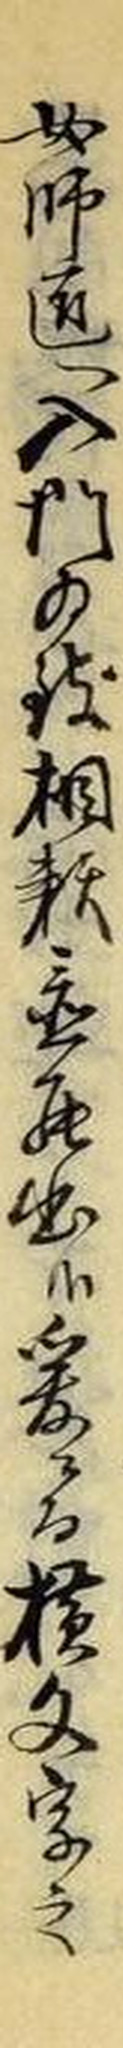女師道へ入門為致相頼置罷出候爰ニ而横文字之
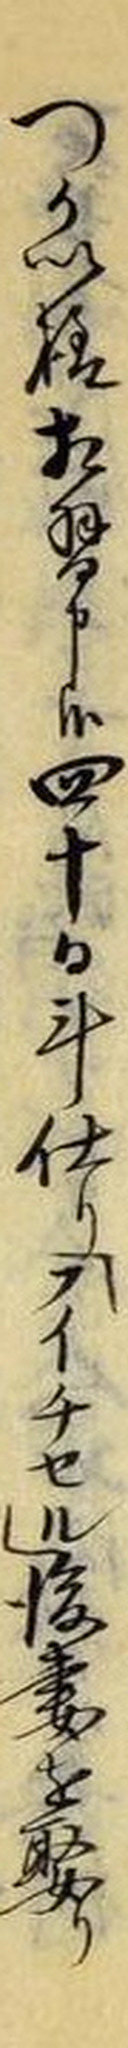つかい様相習申候四十日計仕り「フイチセル」後妻を娶り
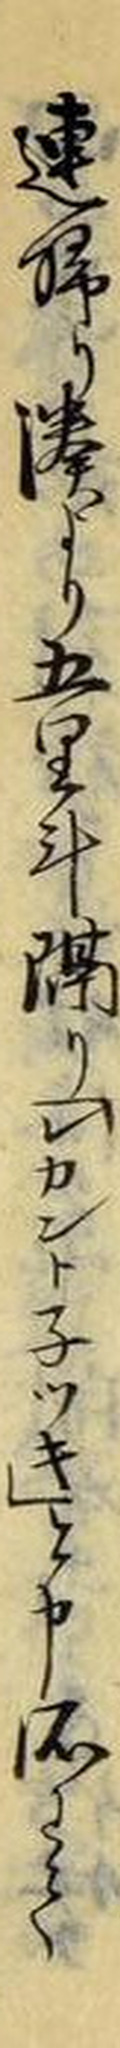連帰り湊より五里計隔り「レカントコツキ」と申所にて

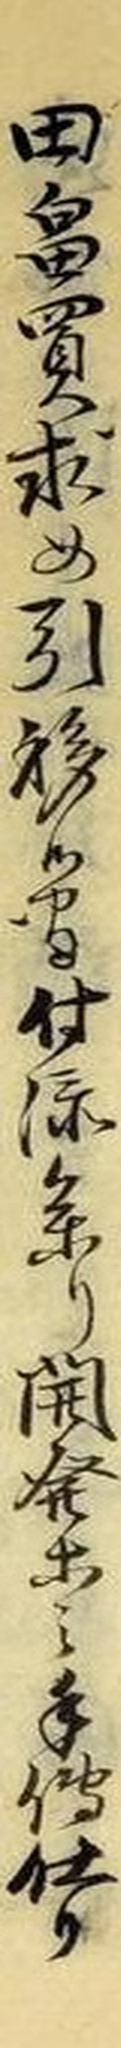田畠買求め引移候間付添参り開発等之手伝仕り
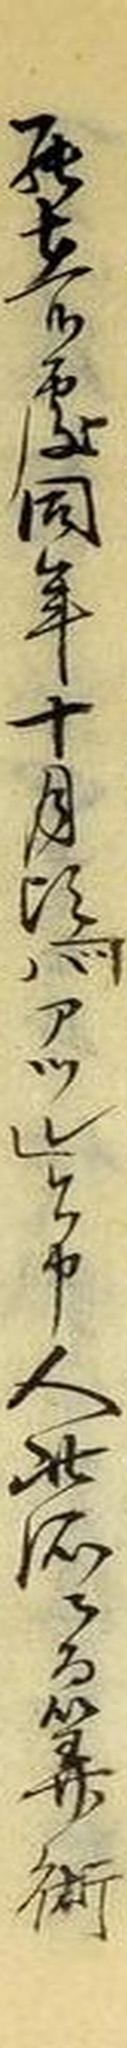罷在候處同年十月頃「バアツレ」と申人此所ニ而算術
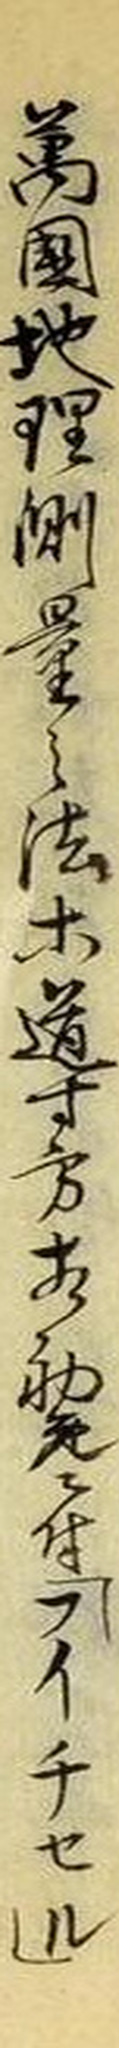万国地理測量之法等導方相初候ニ付「フイチセル」
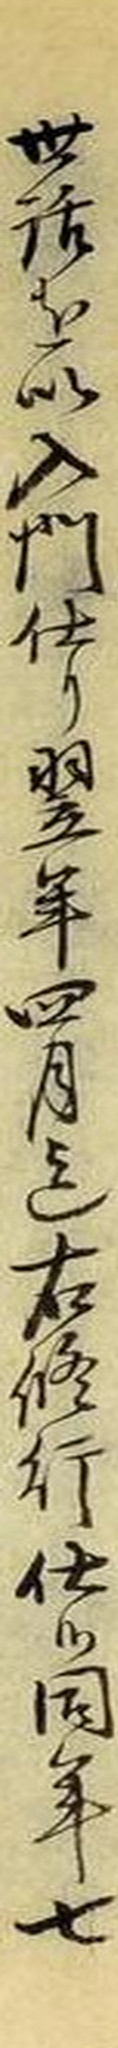世話を以入門仕り翌年四月迄右修行仕候同年七
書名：漂客談奇（備考雑録写8）
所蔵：福井県文書館 Fukui Prefectural Archives
